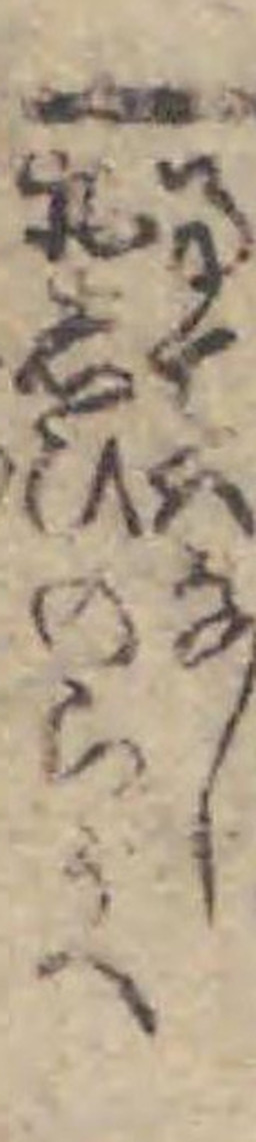おしひのらうへ
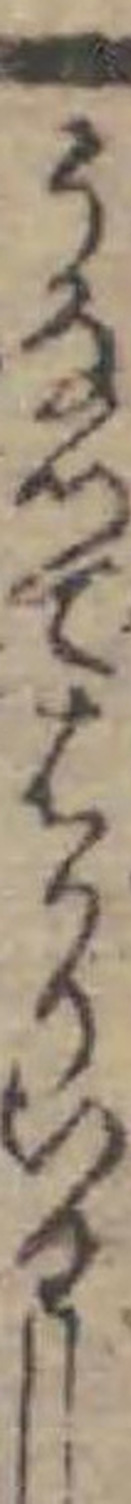うなつてはかりいる
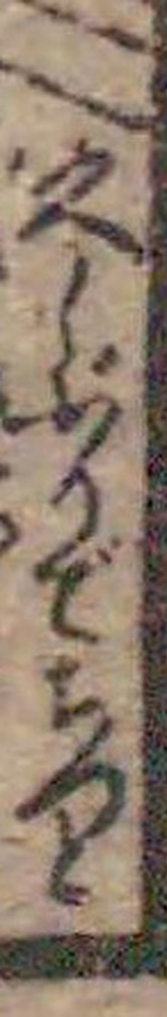久しぶりでちつと
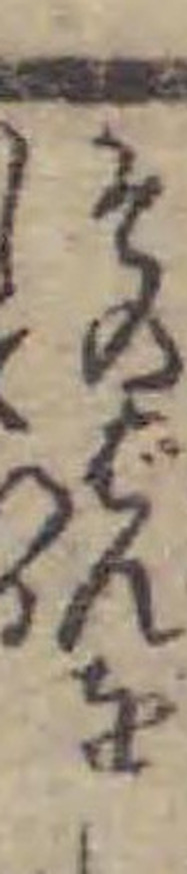そのばんを
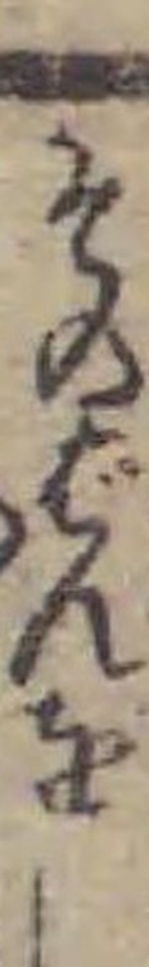そのばんを
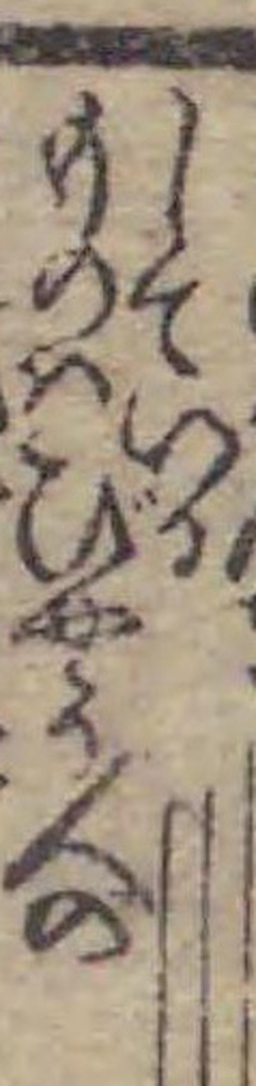ものはびやう人の
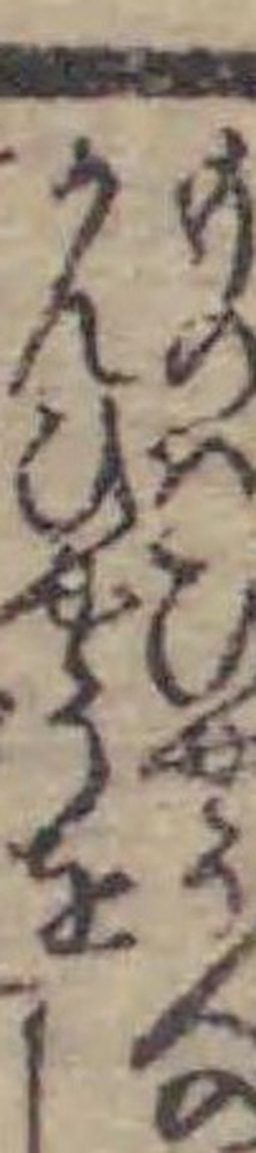かんひやうを
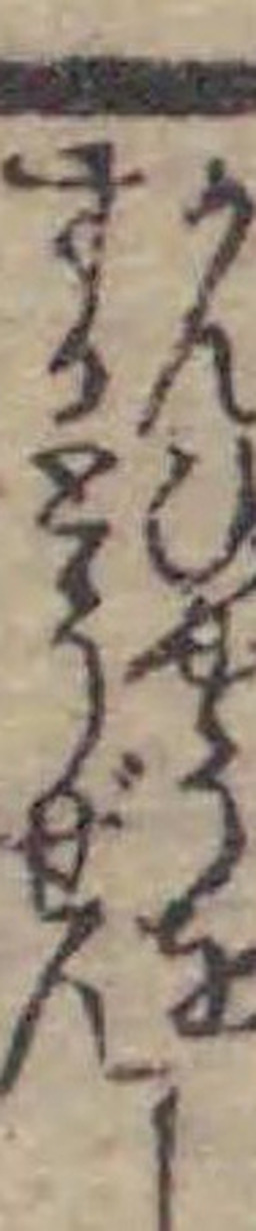するとうぜん
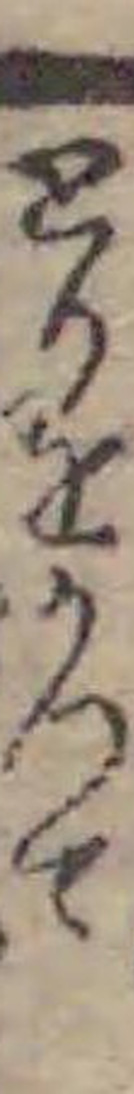とりをかつて
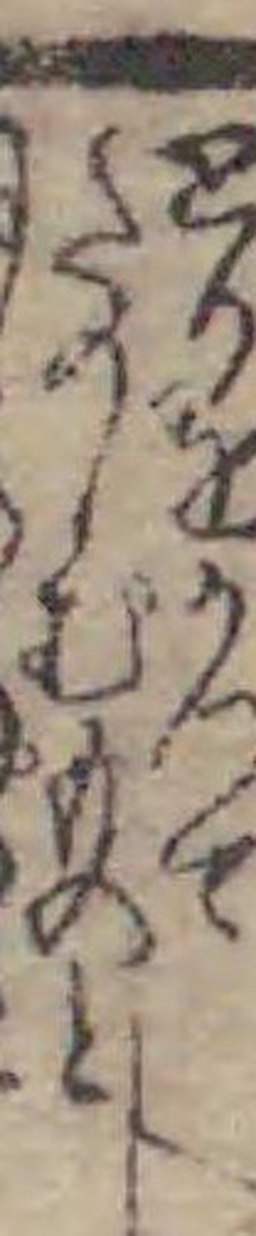たのしむものと
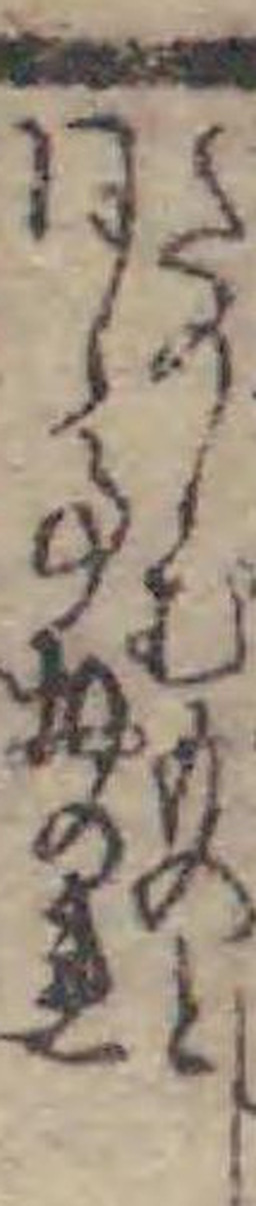同し事おのれ
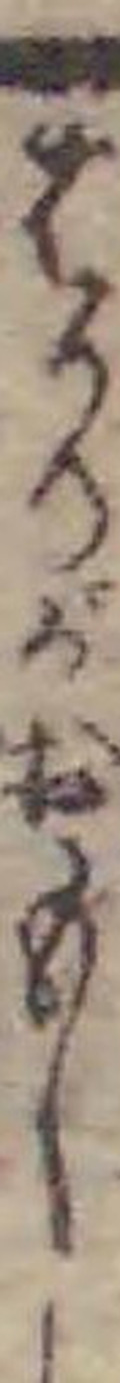はかりがおもし
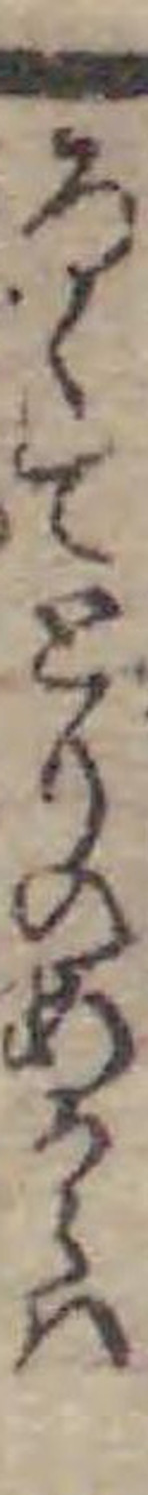ろくてとりのめからは
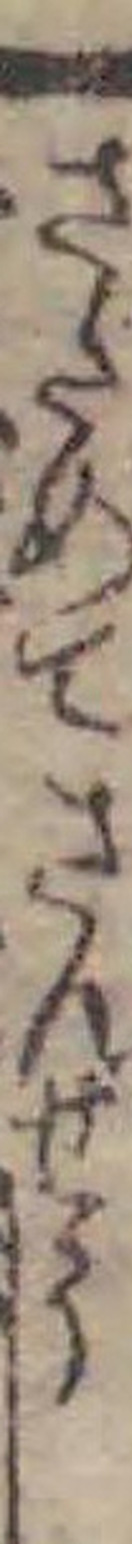さだめてさんせう
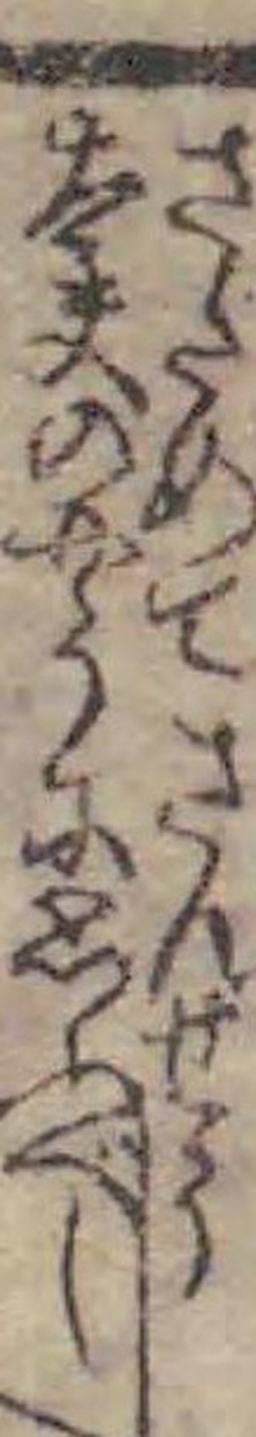太夫のやうに思ふべし
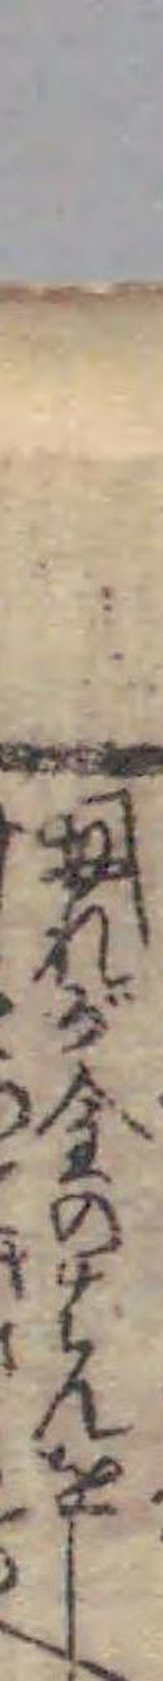〽おれが金のはんを
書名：新鋳小判 : 3巻
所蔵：国立国会図書館 National Diet Library, JAPAN
